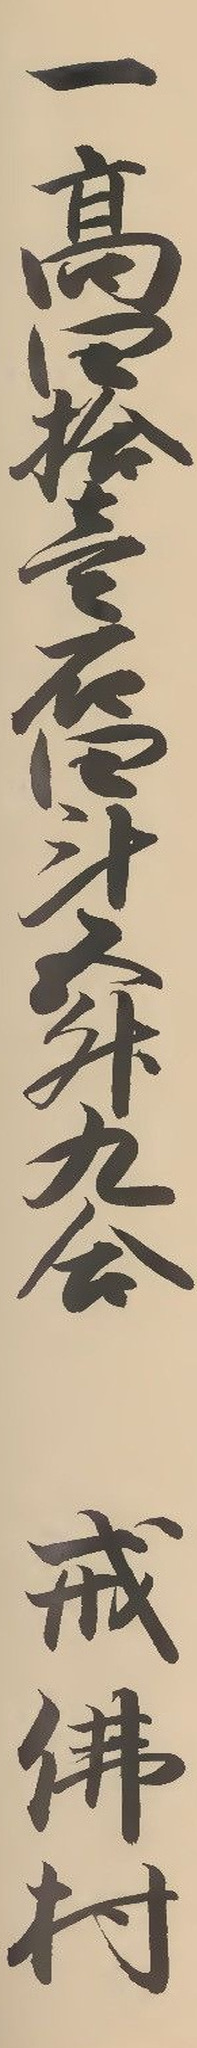一高四拾壱石四斗五升九合戒仏村
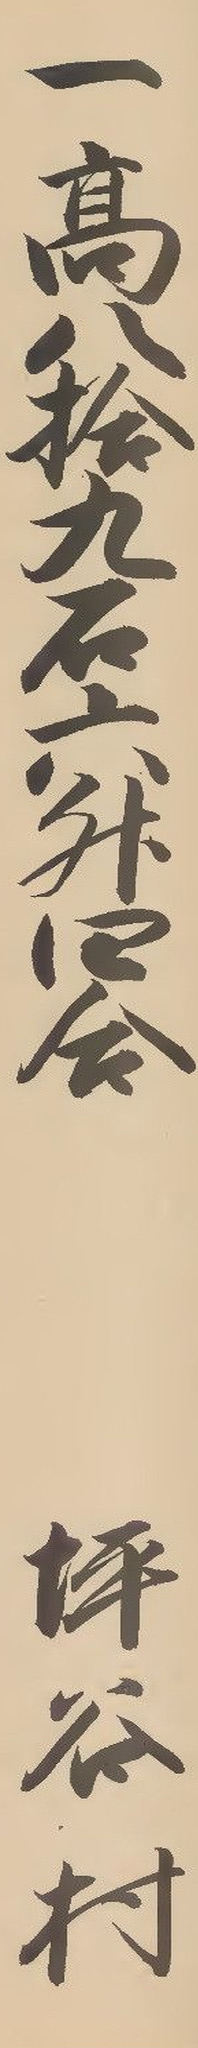一高八拾九石六升四合坪谷村
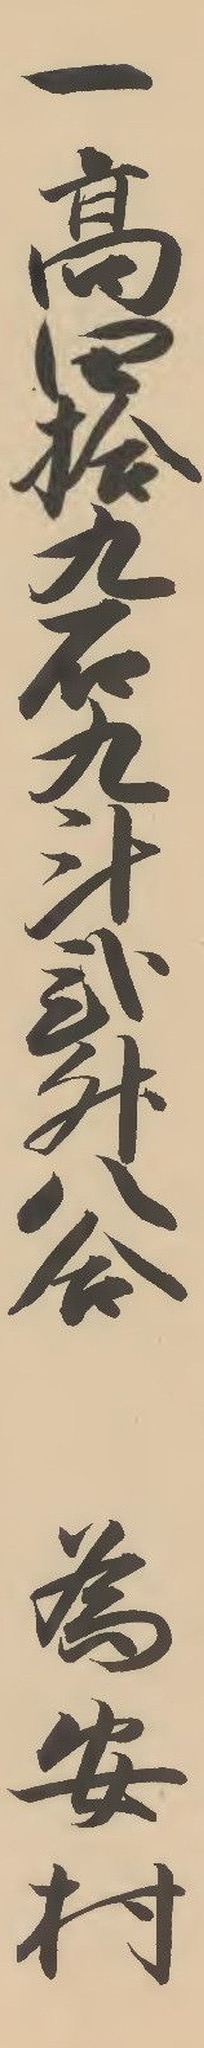一高四拾九石九斗弐升八合為安村
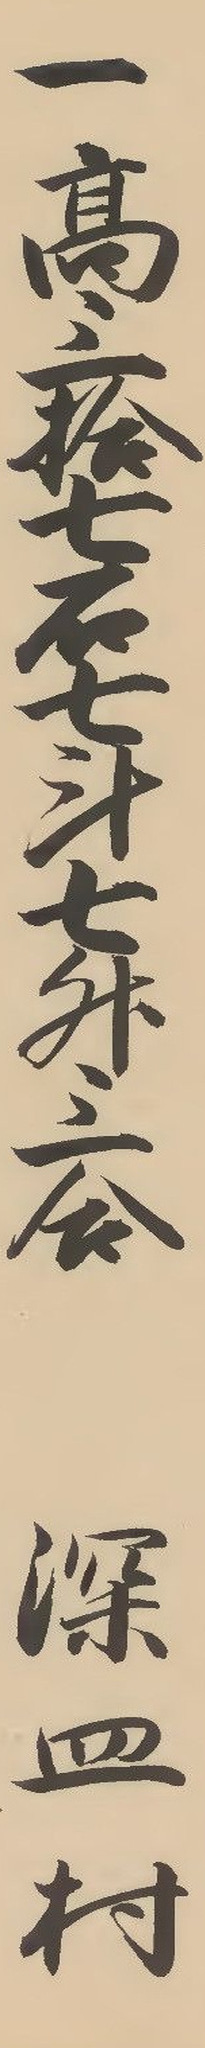一高三拾七石七斗七升三合深皿村
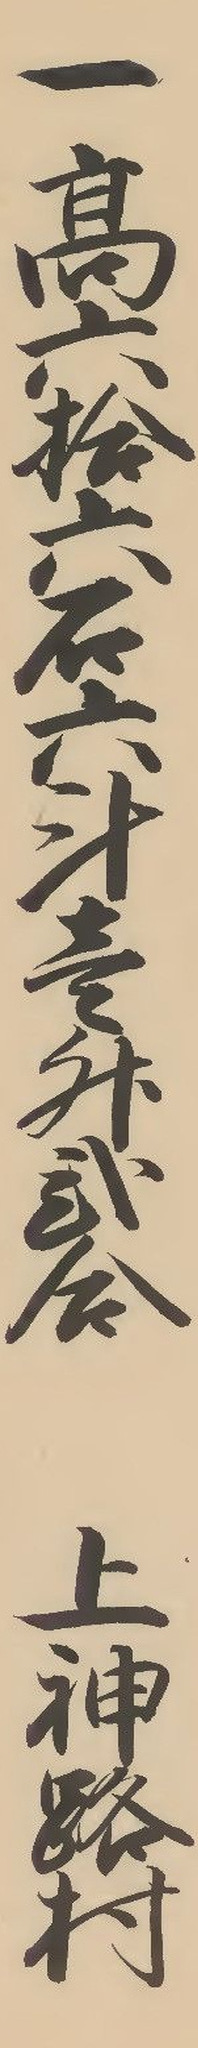一高六拾六石六斗壱升弐合上神路村

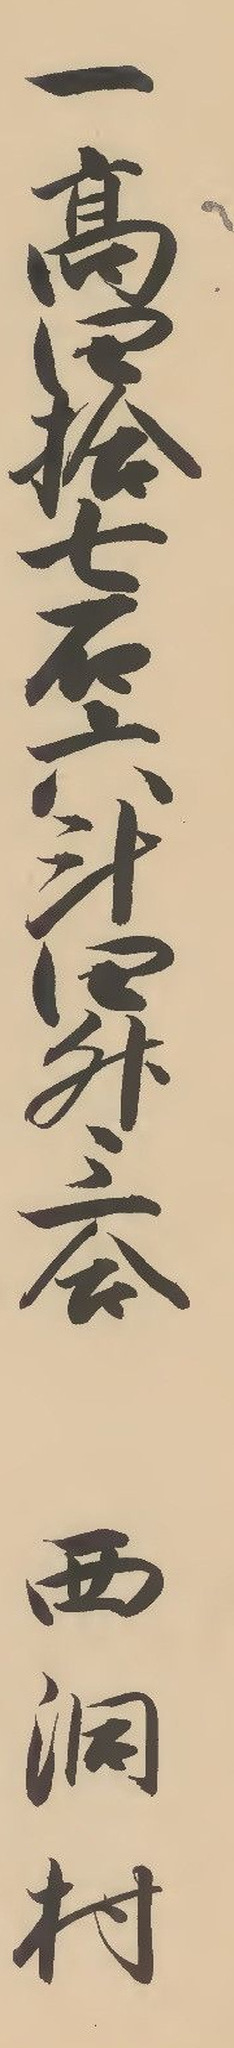一高四拾七石六斗四升三合西洞村
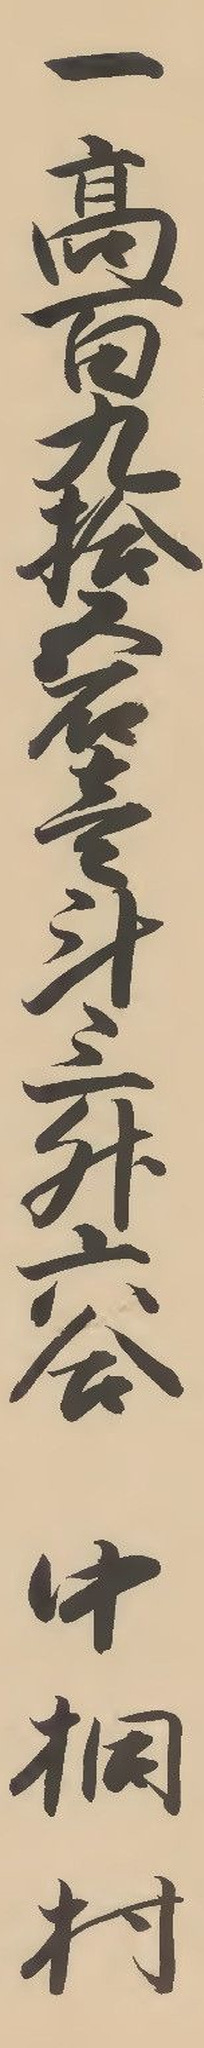一高百九拾五石壱斗三升六合中桐村
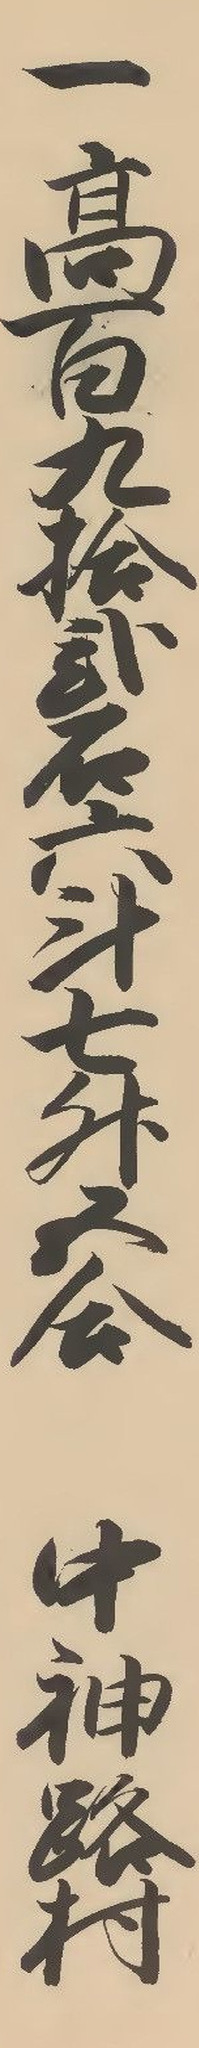一高百九拾弐石六斗七升五合中神路村
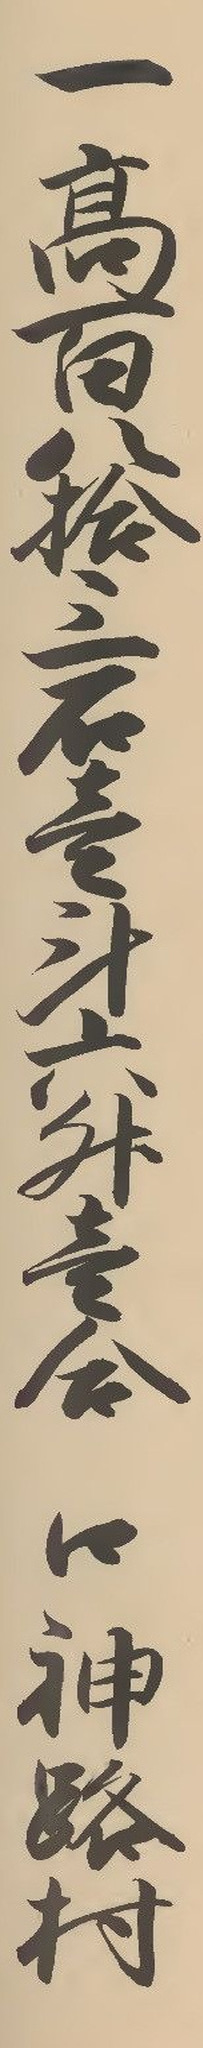一高百八拾三石壱斗六升壱合口神路村
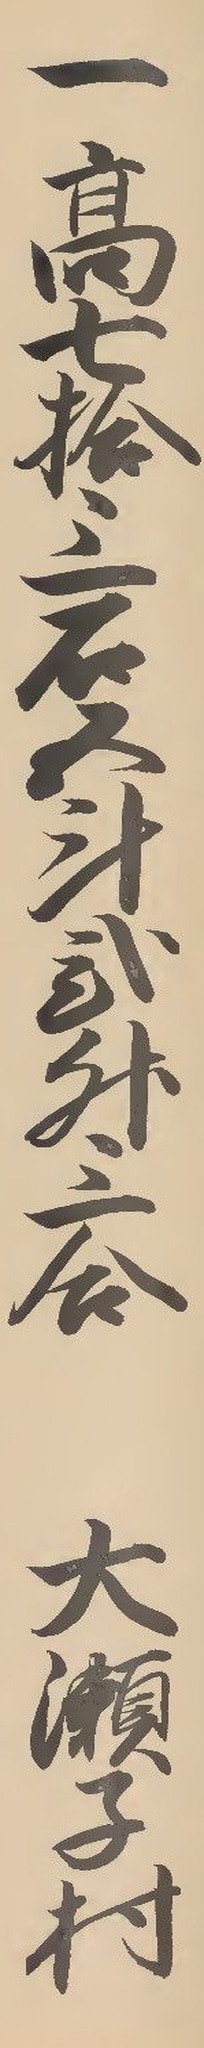一高七拾三石五斗弐升三合大瀬子村
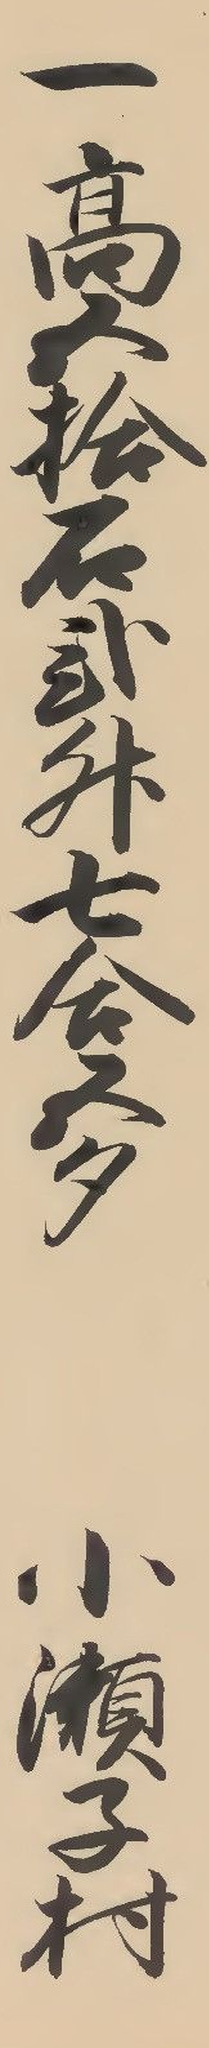一高五拾石弐升七合五勺小瀬子村
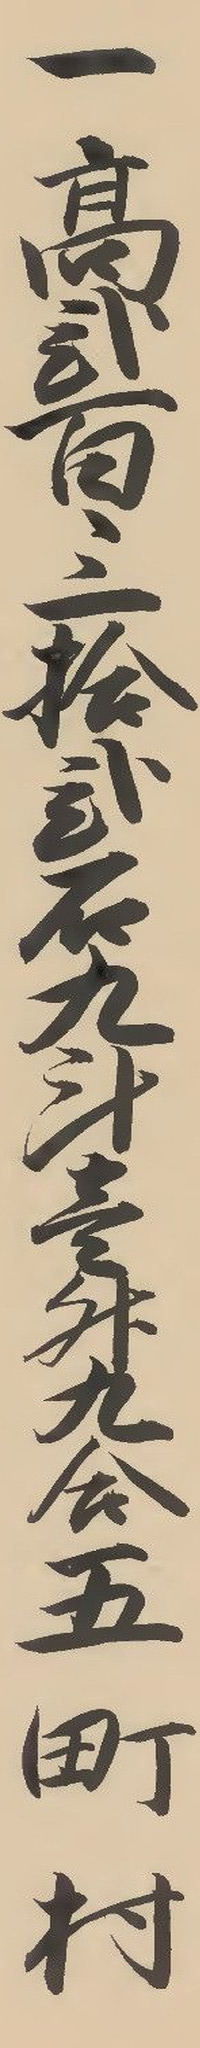一高弐百三拾弐石九斗壱升九合五町村
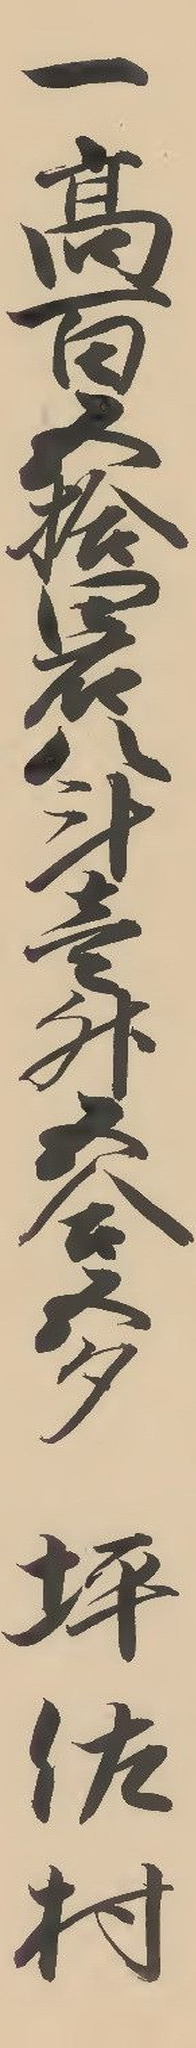一高百五拾四石八斗壱升五合五勺坪佐村

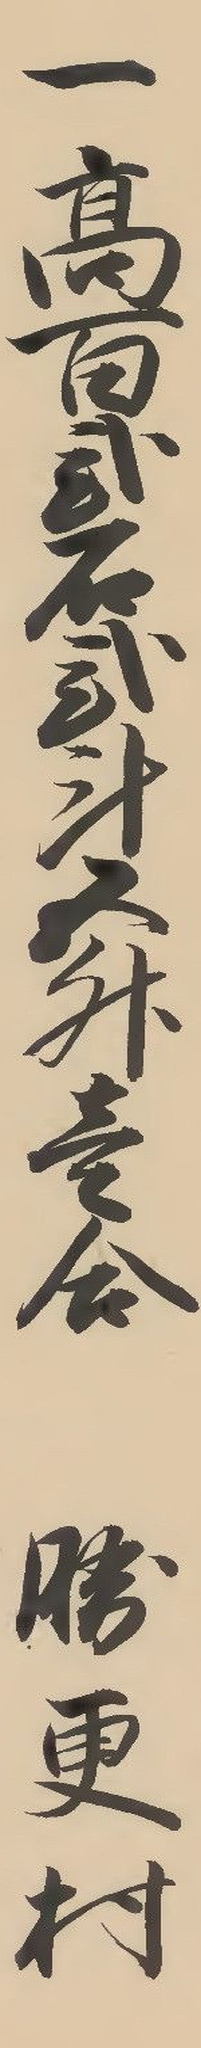一高百弐石弐斗五升壱合勝更村
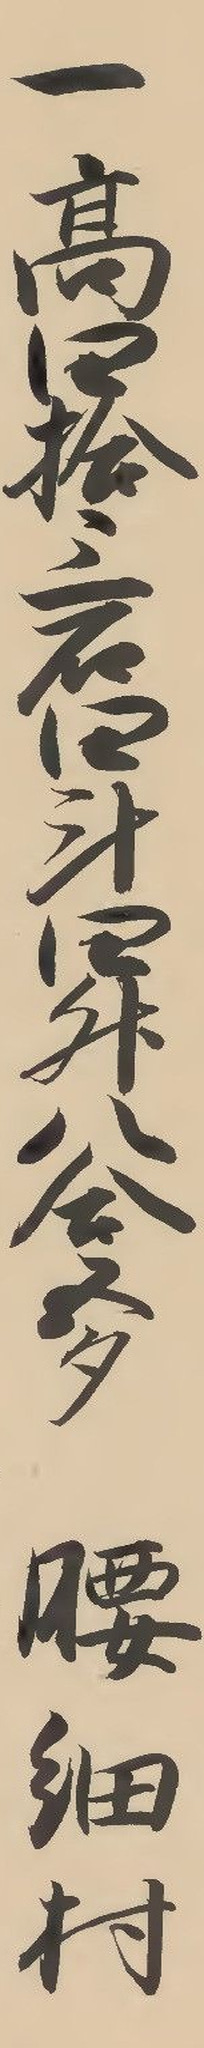一高四拾三石四斗四升八合五勺腰細村
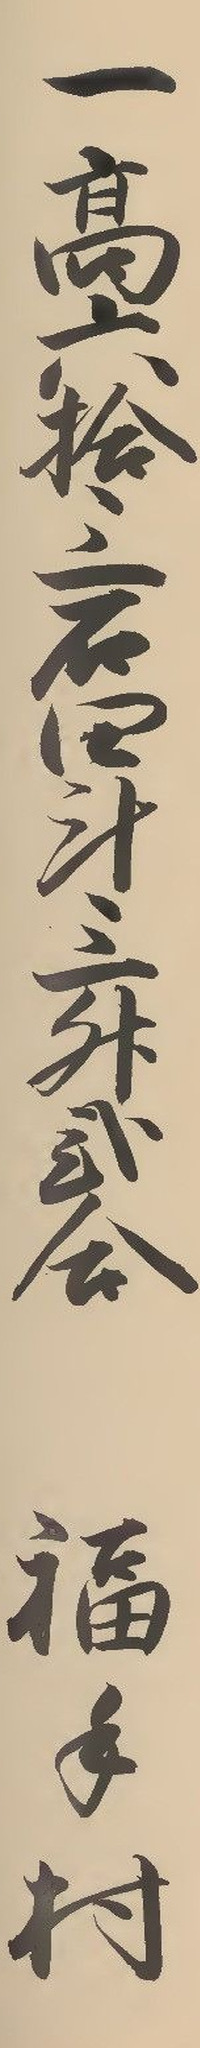一高六拾三石四斗三升弐合福手村
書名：美濃国郷帳
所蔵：国立公文書館 National Archives of Japan
